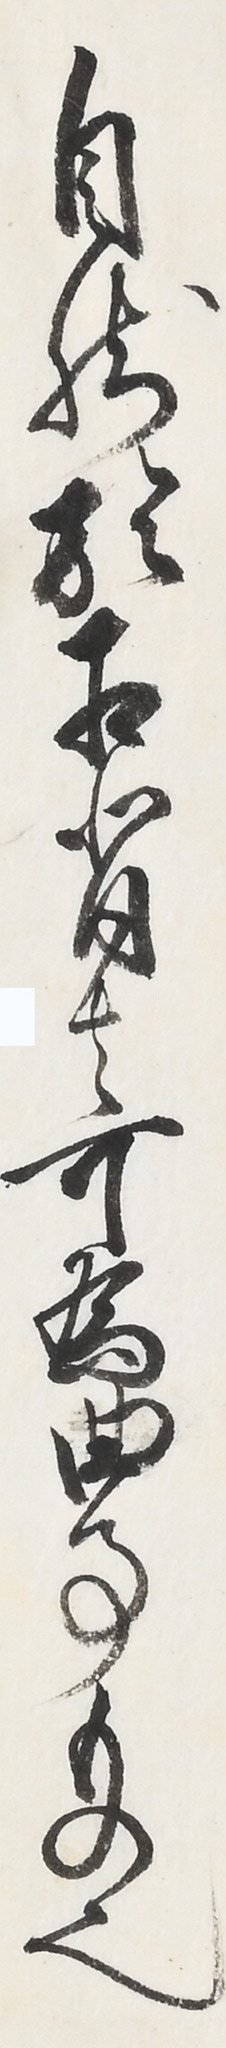自然於相背者可為曲事もの也
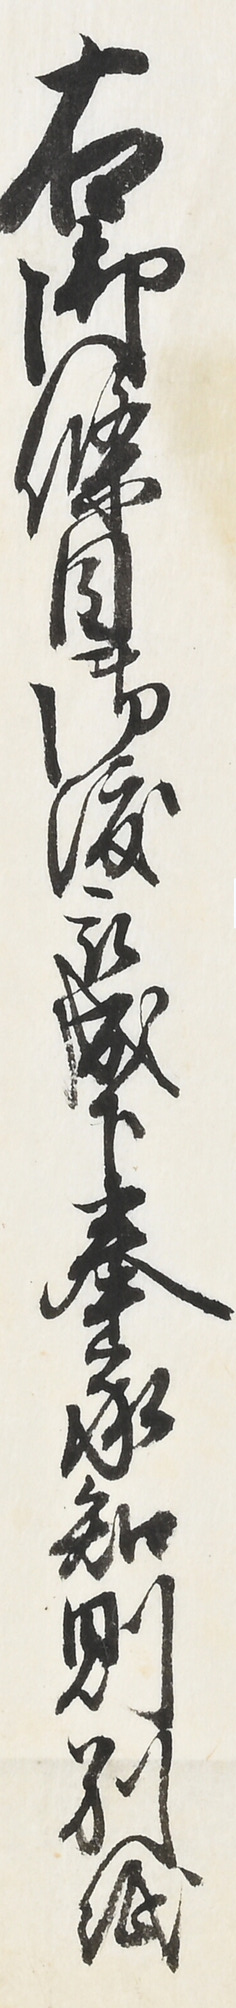右御條目御渡被成下奉承知則別紙
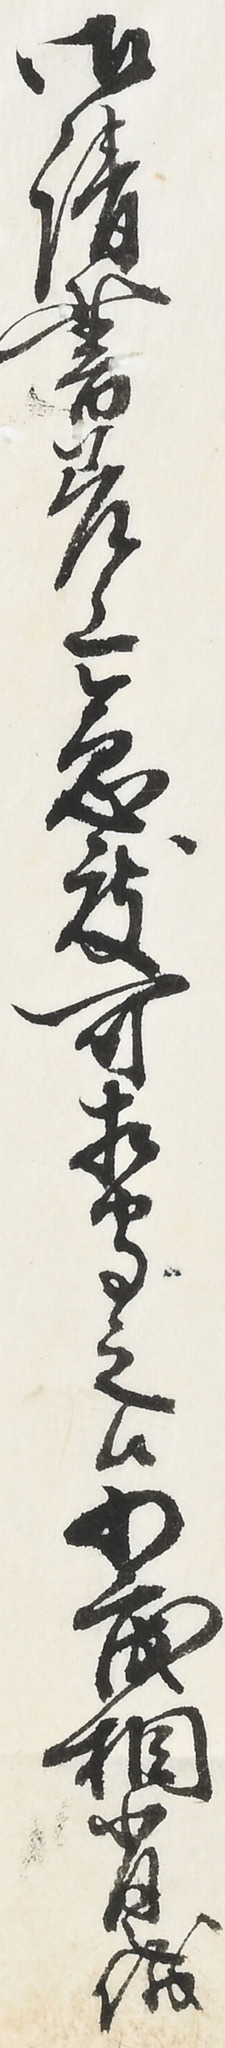請書差上急度可相守之候少茂相背儀

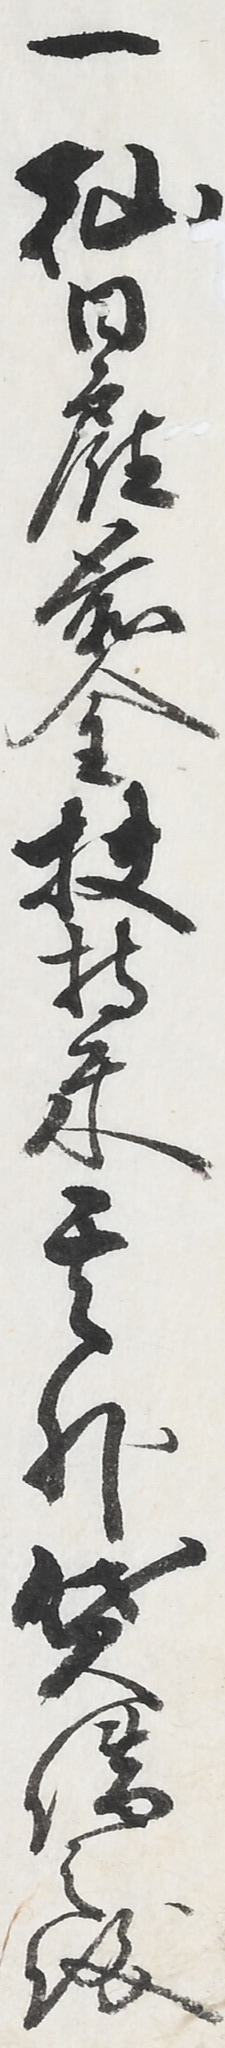一杣日雇前金扶持米其外貸借之儀
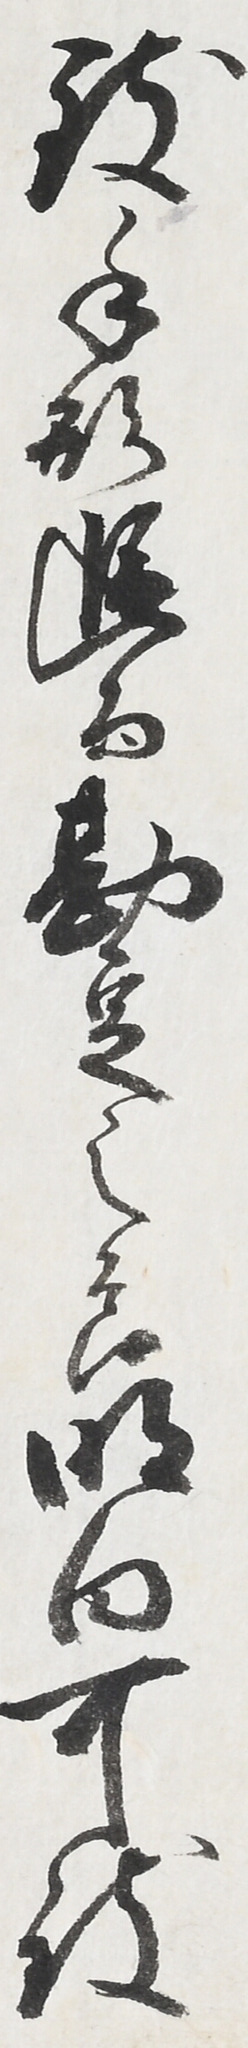致手形追而勘定之節明白可致
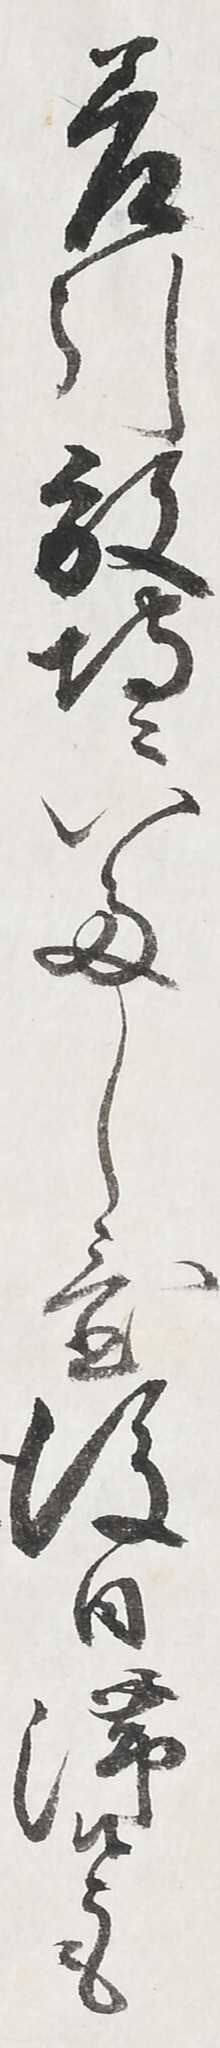差引放埒ニいたし置後日滞候とも
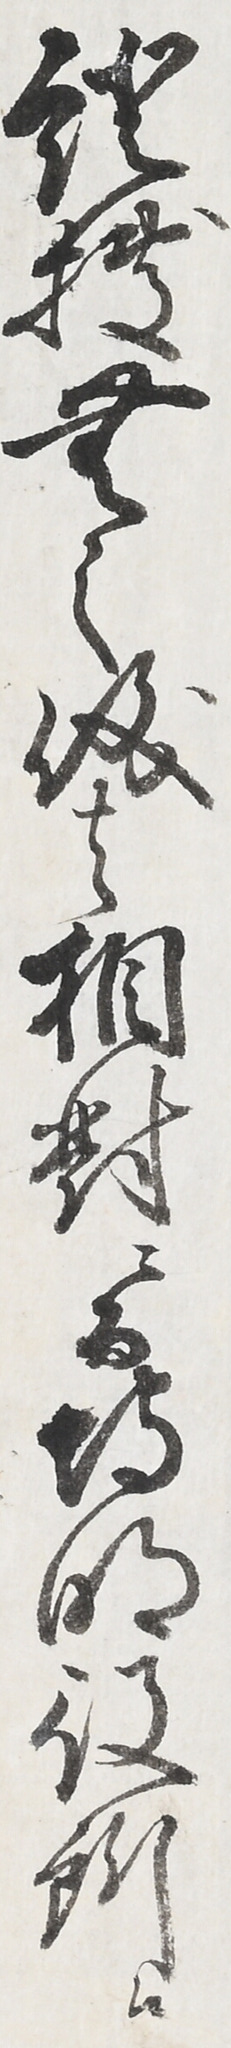証拠無之儀者相対ニ而埒明役所江
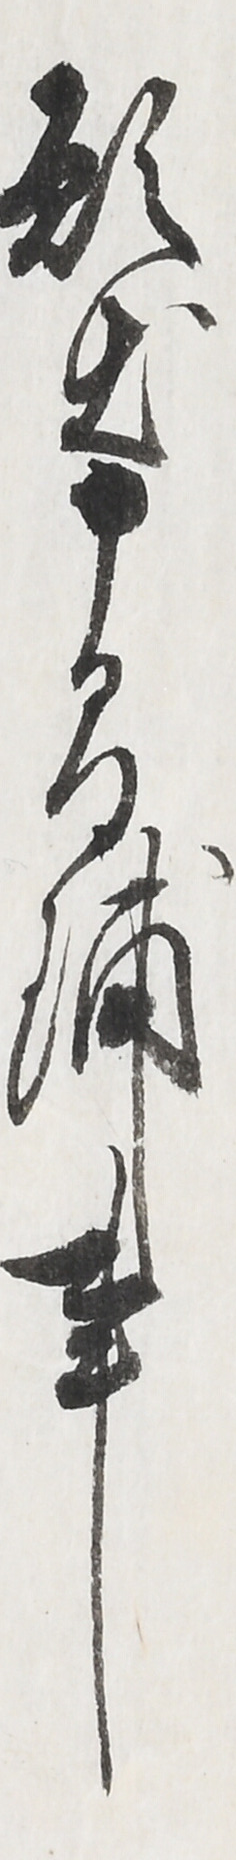願出申間敷事
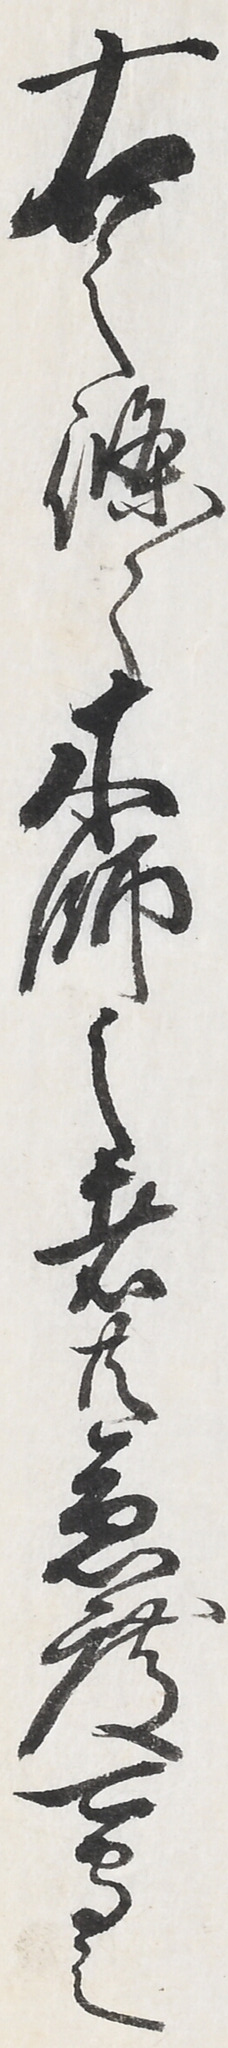右之條々木師之者共急度可守之
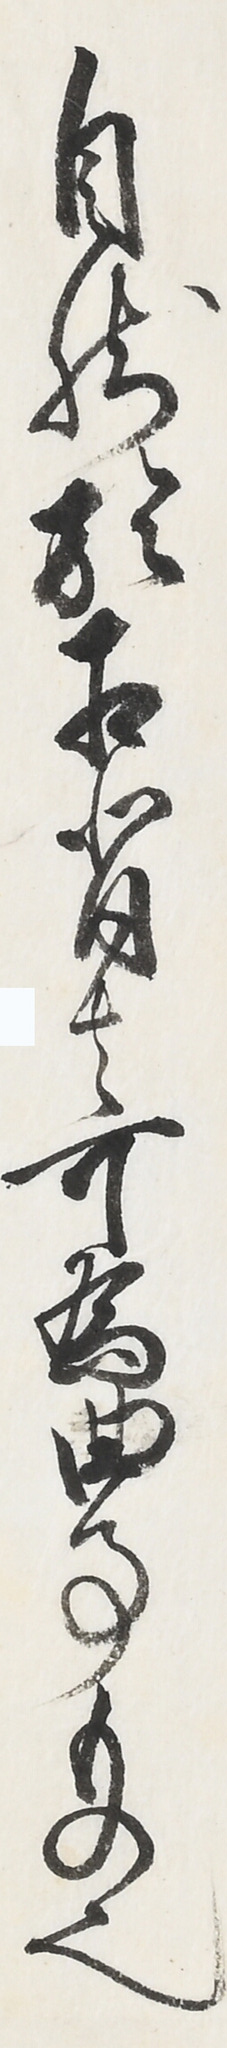自然於相背者可為曲事もの也
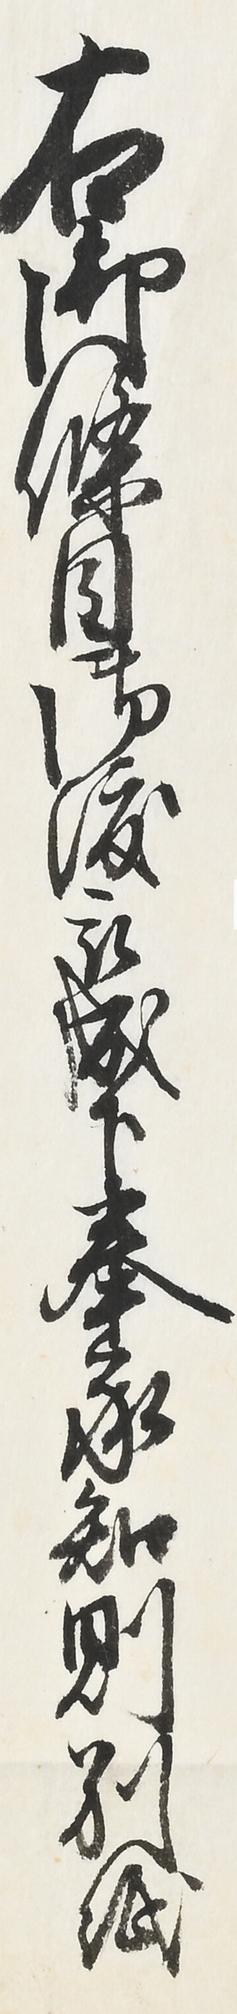右御條目御渡被成下奉承知則別紙
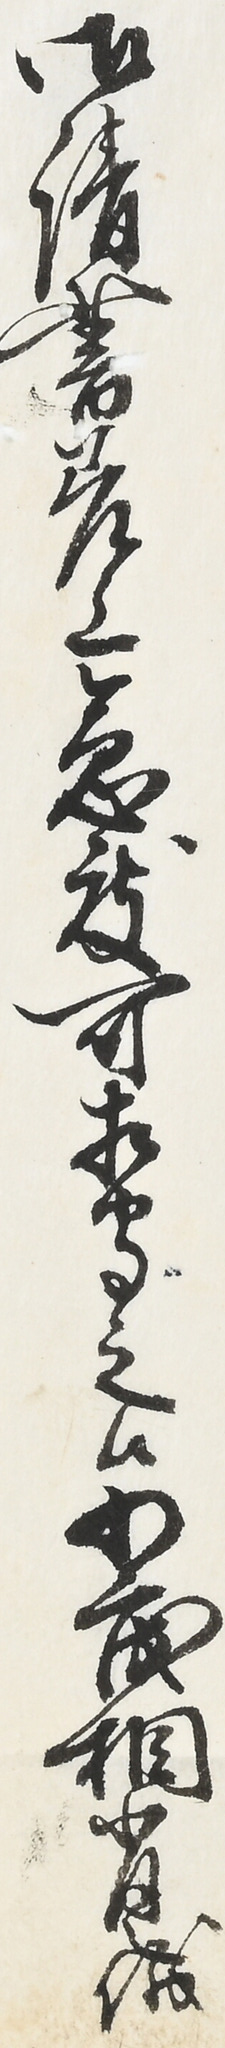請書差上急度可相守之候少茂相背儀

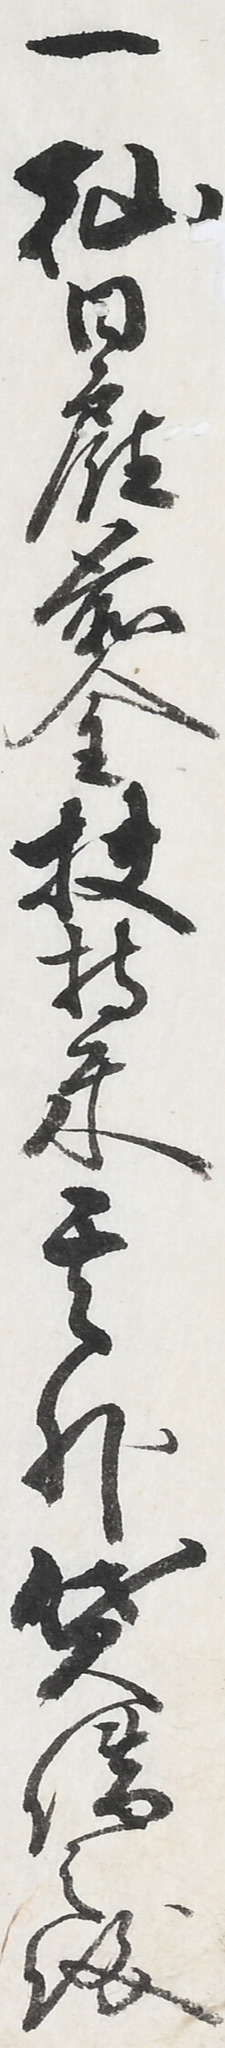一杣日雇前金扶持米其外貸借之儀
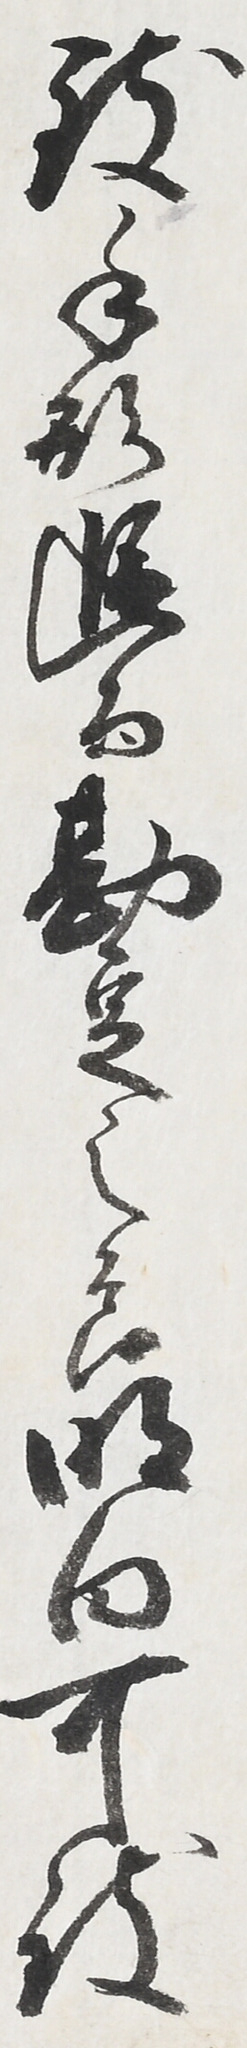致手形追而勘定之節明白可致
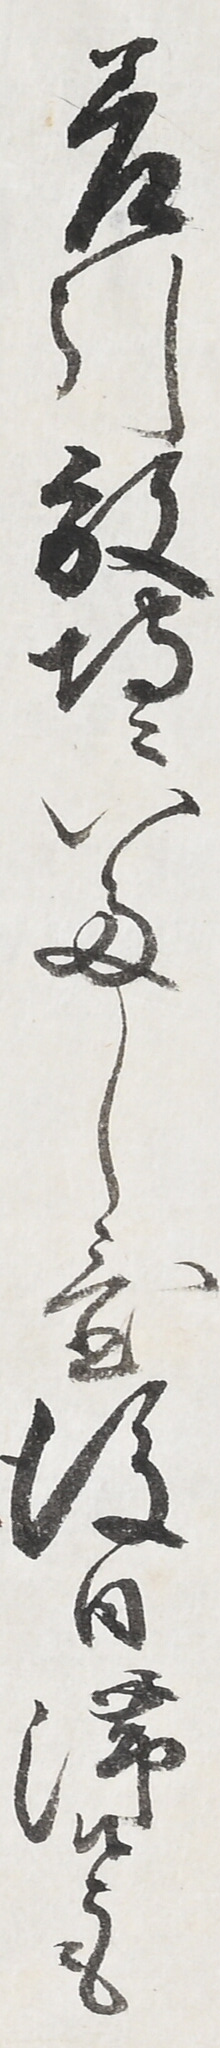差引放埒ニいたし置後日滞候とも
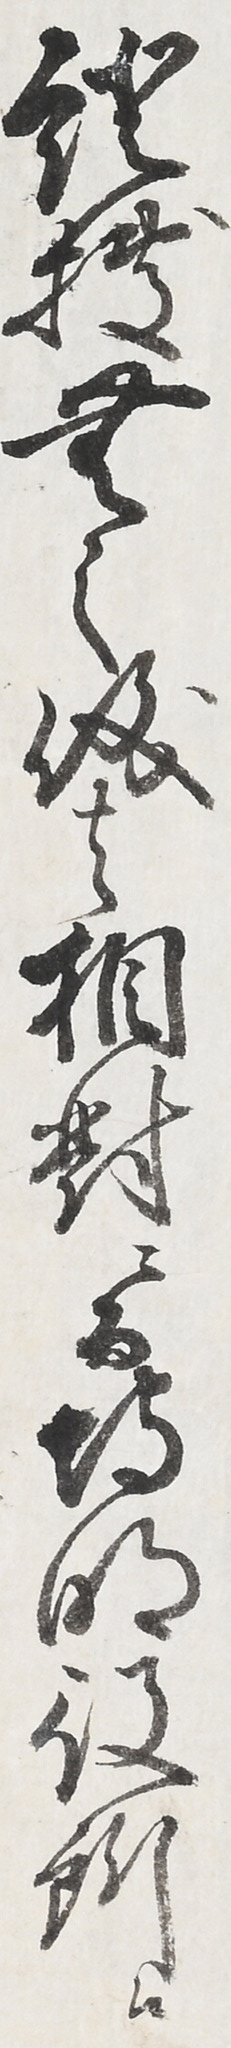証拠無之儀者相対ニ而埒明役所江
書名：小白木條目請書并判取帳
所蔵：伊那市立高遠町図書館・合同会社AMANE
